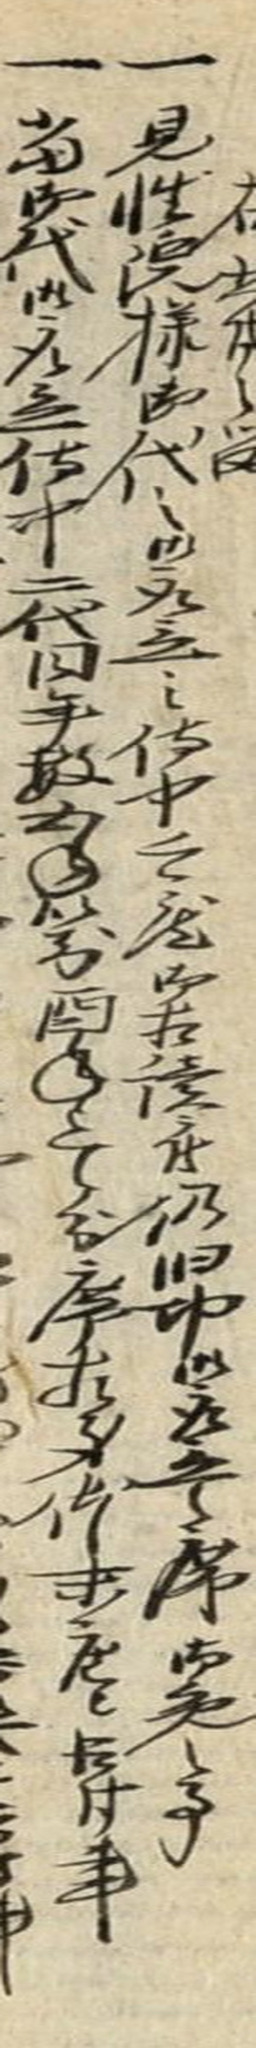一当御代御取立侍中二代目年数五年以前酉年迄之分席相身体未座被仰付事
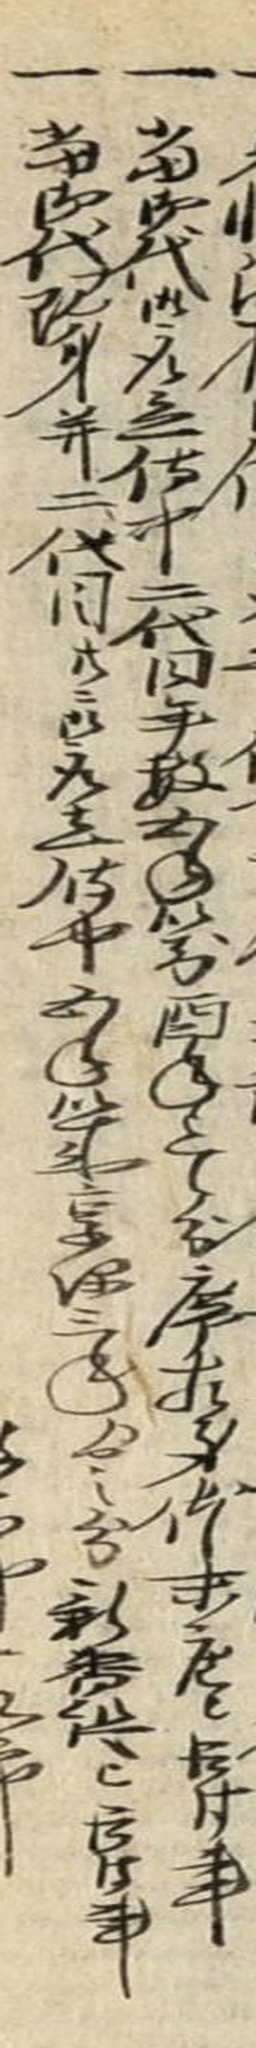一当御代現身并二代目共に御取立侍中五年以来享保三年ゟ之分新番組へ被仰付事
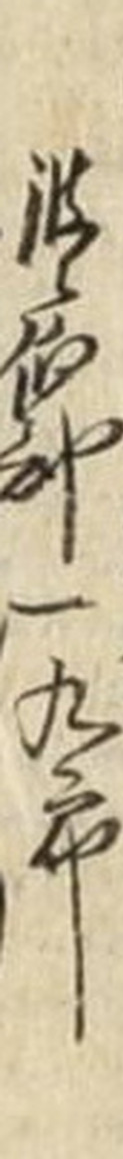波々伯部一九郎
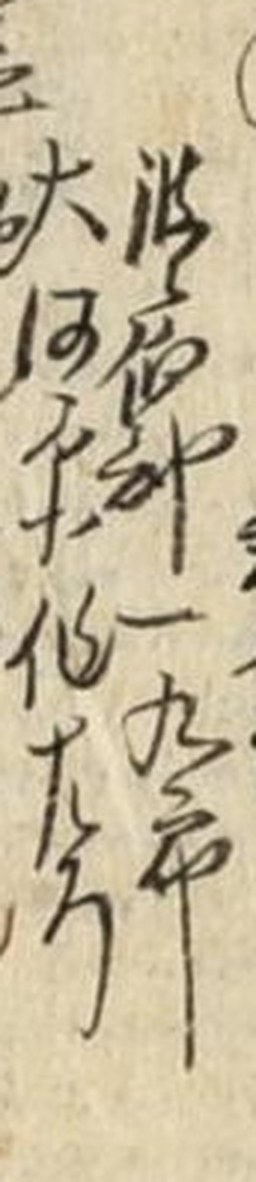大河原作左衛門

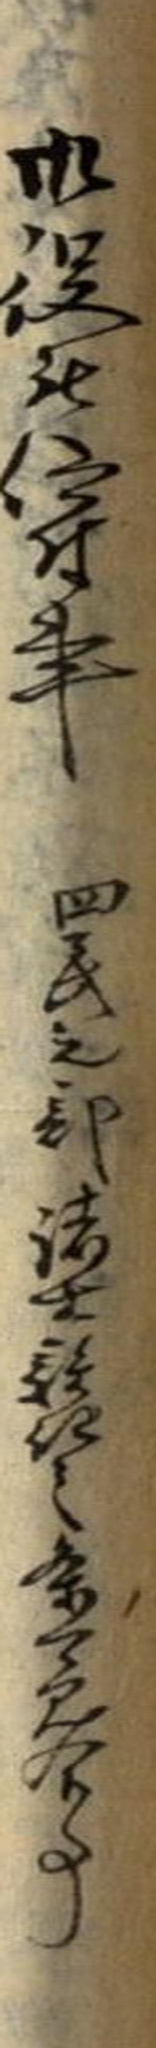御役被仰付事四民之部諸士雑記之条可見合事
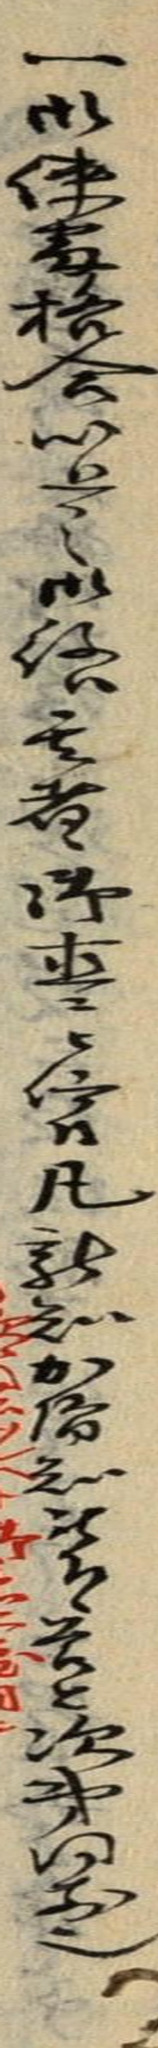一御使番格合以上之御役は其者へ御直々被仰付凡新知加増知被下候節と次第同前也
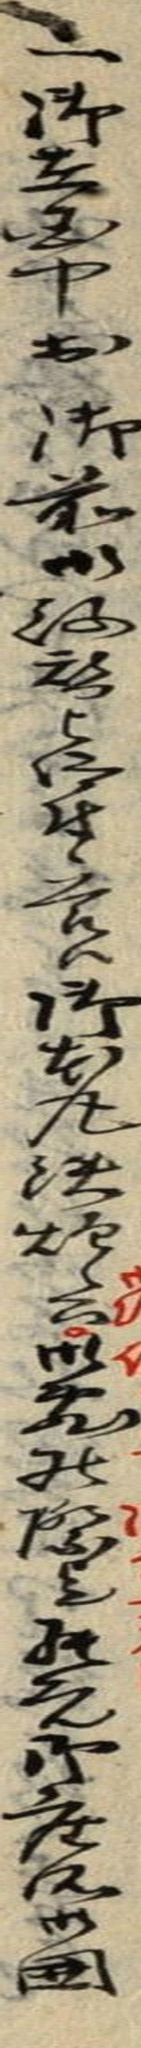一御在国中於御前御役替被仰付候節は御本丸鉄炮之間◦御敷居際迄罷出ル御座所御囲
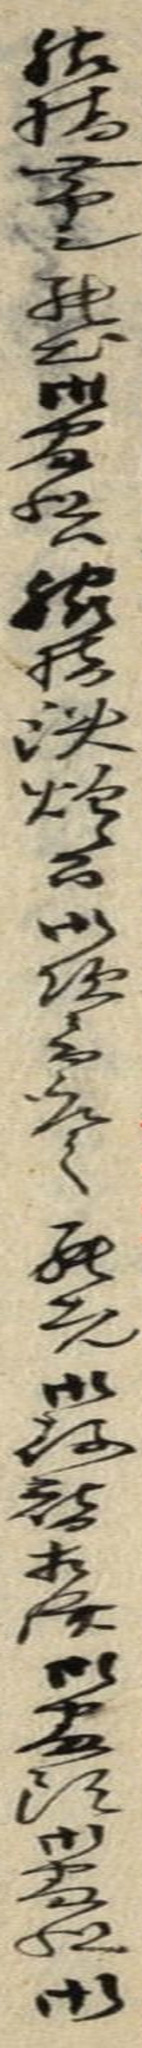脇指帯し罷出御番組は脇指鉄炮之間御次に而取之罷出ル御役替相済御番頭御番組御
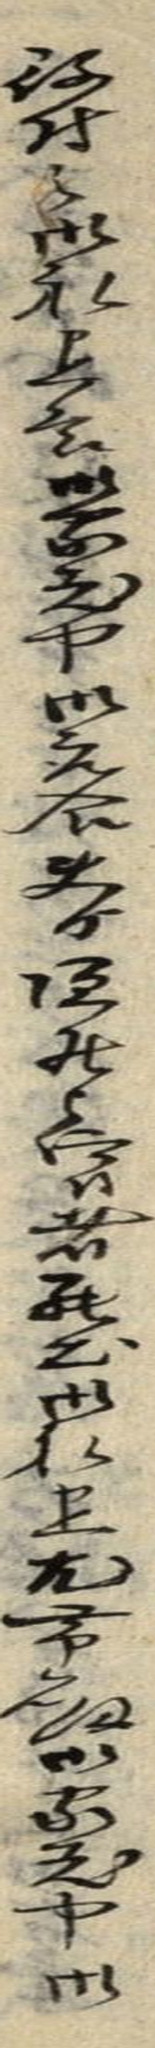役付之御礼申上候節御家老中御取合夫ゟ隠居被仰付候者罷出御礼申上尤帯剱御家老中御
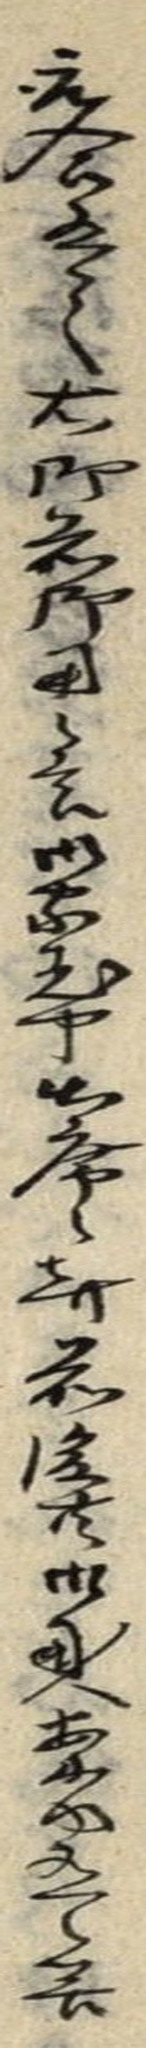取合有之右御前御用之節御家老中出席候刻前後共御用人案内有之筈
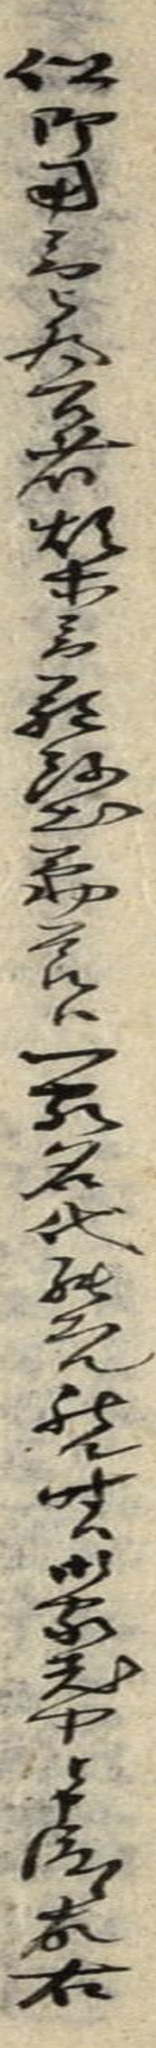但御用に而被為召候者煩等に而難致出勤候節は一類名代罷出ル然ル時は御家老中被申渡候故右
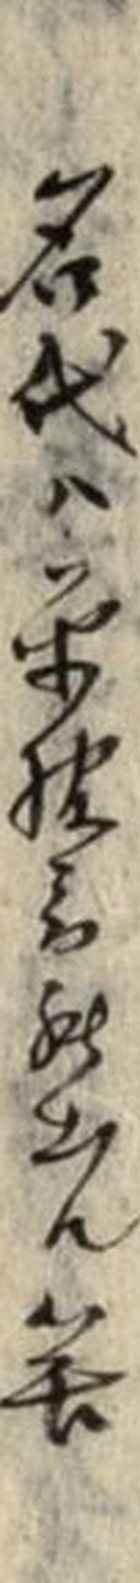名代は平服に而罷出ル筈
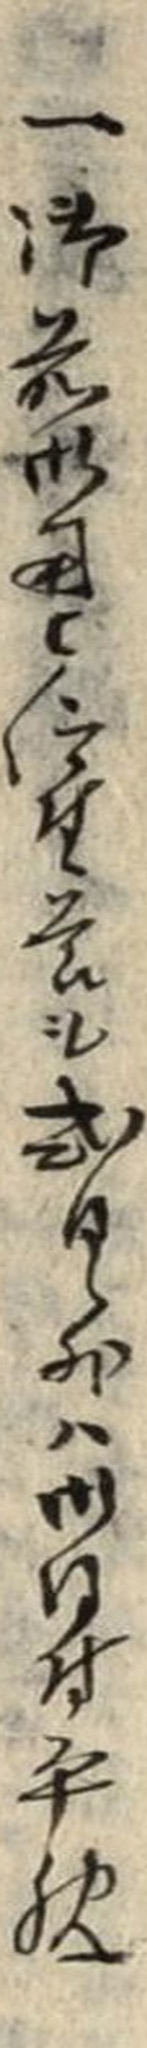一御前御用被仰付候節も式日之外は御目付平服
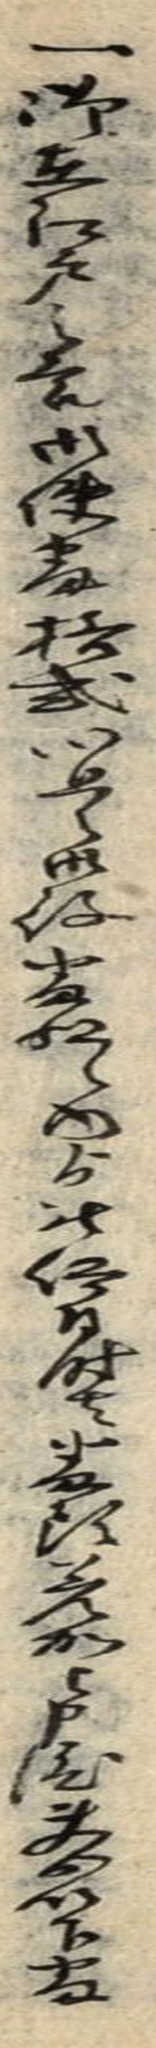一御在江戸之節御使番格式以上之御役番組之内ゟ被仰付時は番頭差加被申渡夫ゟ以下番
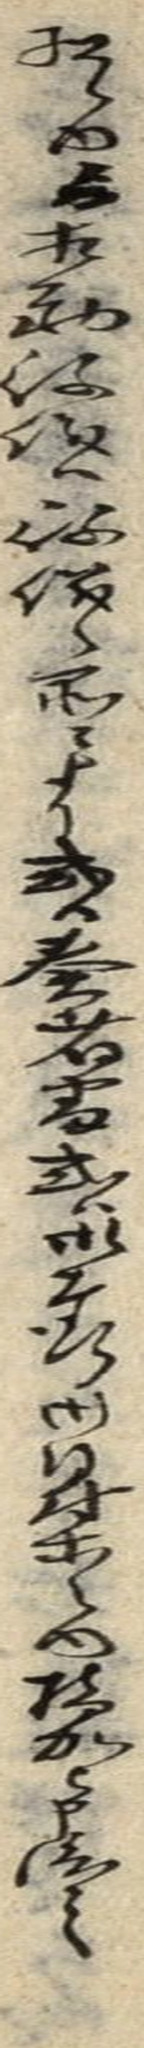組之内に而相勤役儀は役儀之品により或は奏者番或は御奉行御目付等之内指加被申渡之
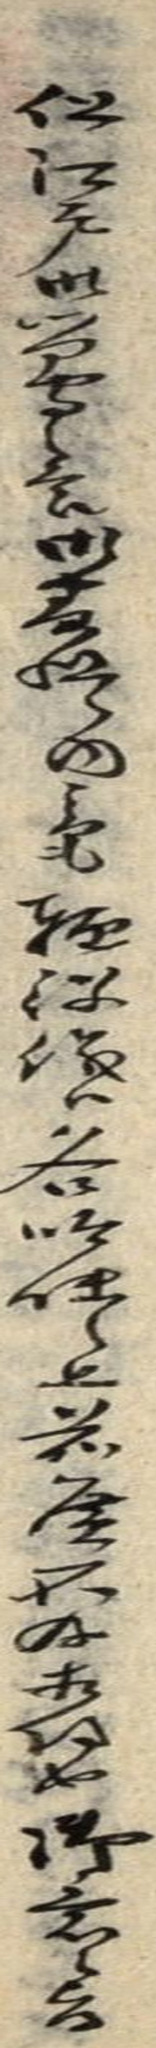但江戸御留守之節御番組之内に而も軽役儀は各吟味之上前広不及相伺由御意之旨
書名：御用并被仰出之部
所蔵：福井県文書館 Fukui Prefectural Archives
